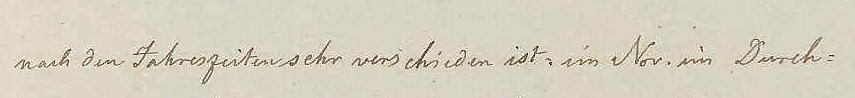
nach den Jahreszeiten sehr verschieden ist: im Nov.November im Durch-
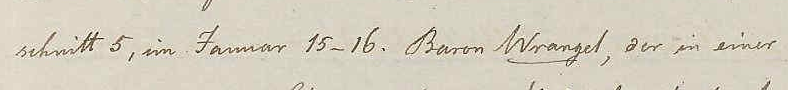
schnitt 5, im Januar 15–16. Baron Wrangel, der in einer
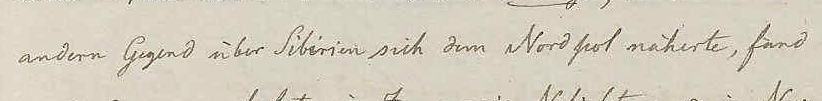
andern Gegend über Sibirien sich dem Nordpol näherte, fand
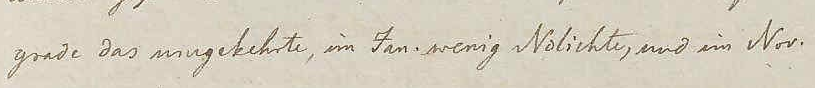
grade das umgekehrte, im Jan. wenig Ndlichte, und im Nov.
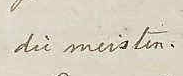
die meisten.
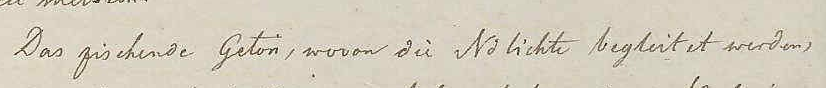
Das zischende Getön, wovon die Ndlichte begleitet werden,
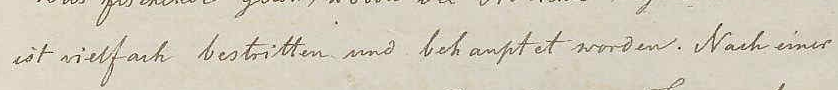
ist vielfach bestritten und behauptet worden. Nach einer
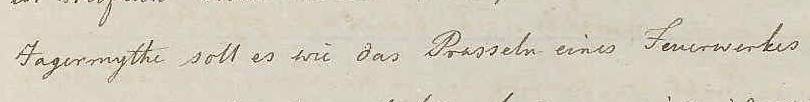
Jagermythe soll es wie das Prasseln eines Feuerwerkes
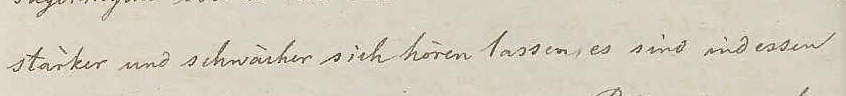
stärker und schwächer sich hören lassen, es sind indessen
